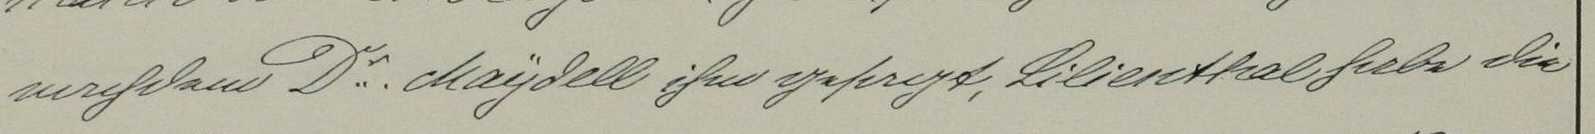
nachdem Dr. Maydell ihm gesagt, Lilienthal habe die
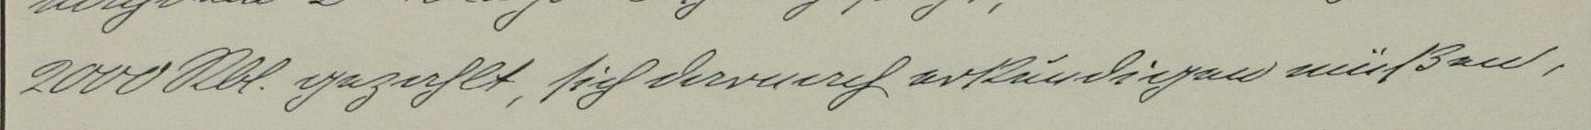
2000 Rbl. gezahlt, sich darnach erkundigen müßen,
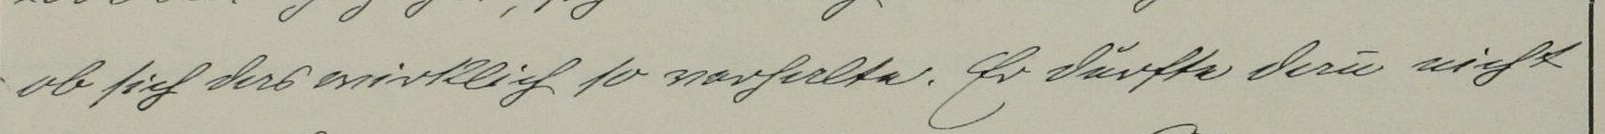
ob sich das wirklich so verhalte. Er durfte dann nicht
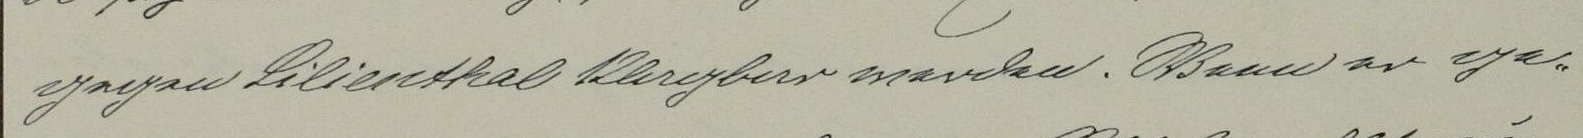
gegen Lilienthal klagbar werden. Wenn er ge-
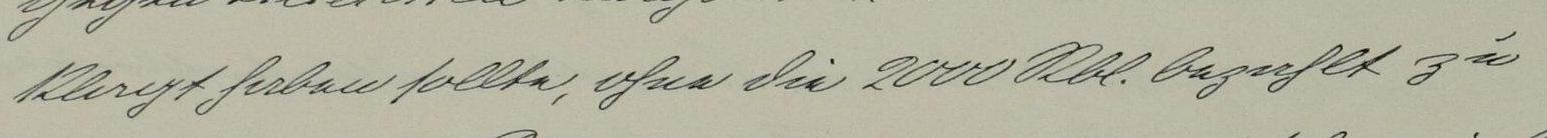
klagt haben sollte, ohne die 2000 Rbl. bezahlt zu
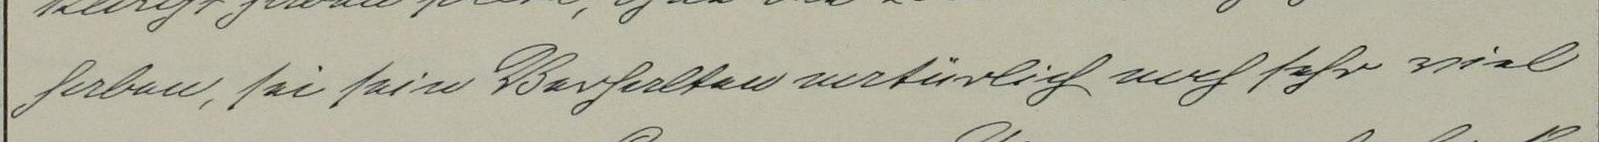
haben, sei sein Verhalten natürlich noch sehr viel
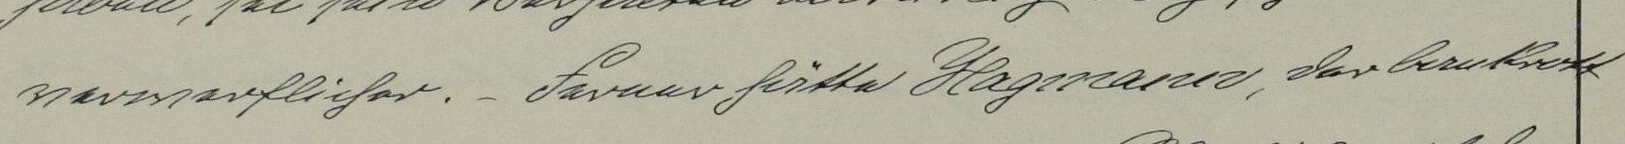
verwerflicher. – Ferner hätte Hagmann, der bankrott
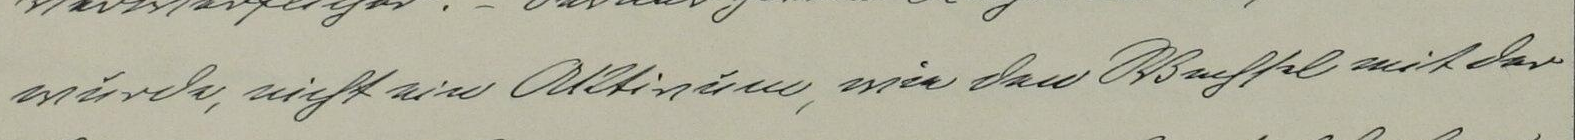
wurde, nicht ein Aktivum, wie den Wechsel mit der
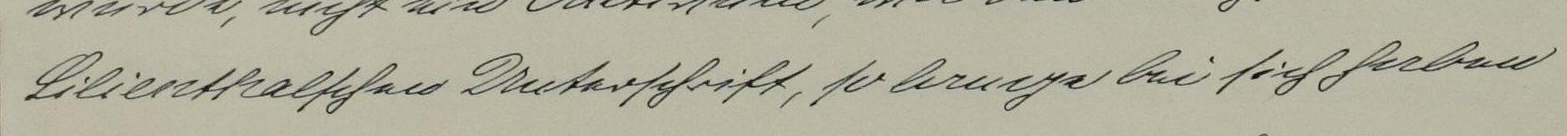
Lilienthalschen Unterschrift, so lange bei sich haben
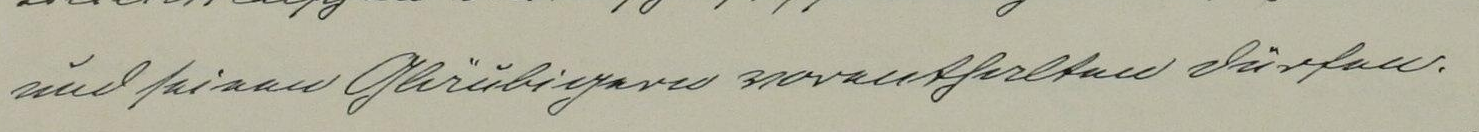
und seinen Gläubigern vorenthalten dürfen.
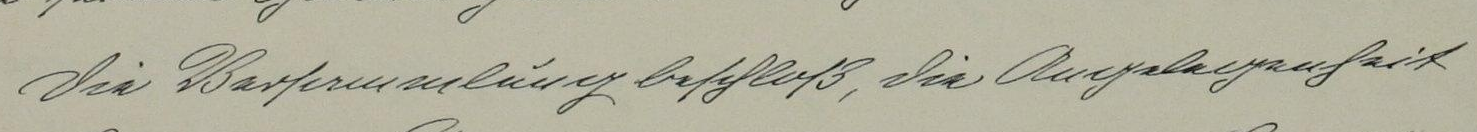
Die Versammlung beschloß, die Angelegenheit
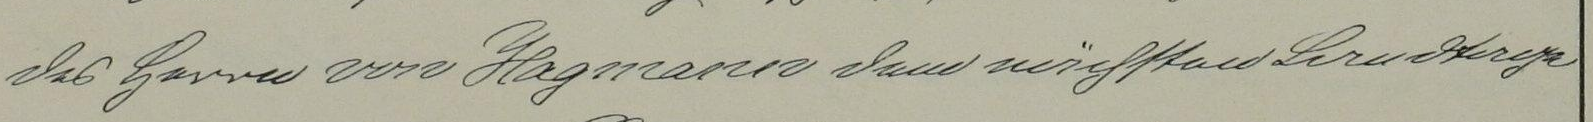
des Herrn von Hagmann dem nächsten Landtage
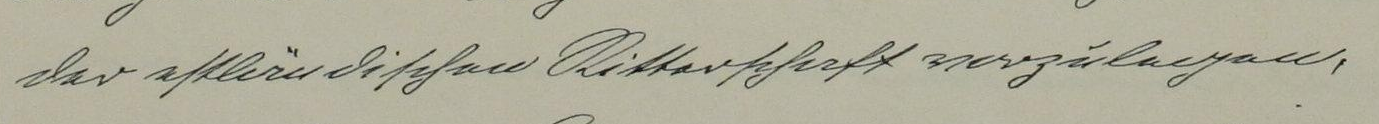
der estländischen Ritterschaft vorzulegen,
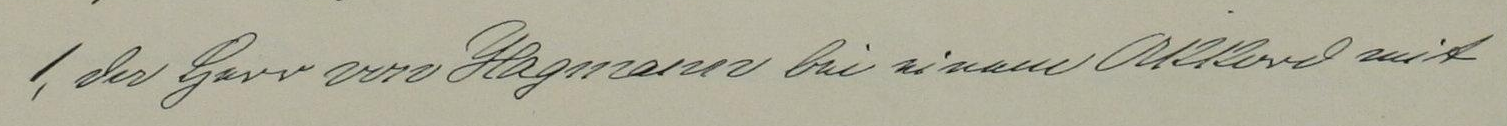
1. da Herr von Hagmann bei einem Akkord mit
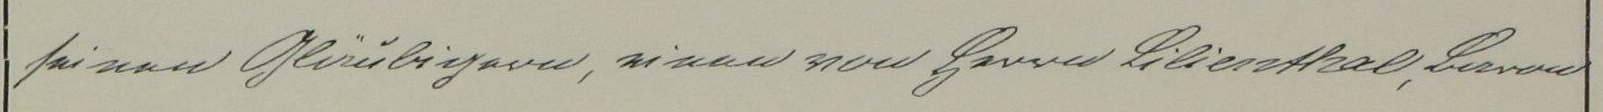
seinen Gläubigern, einen von Herrn Lilienthal, Baron
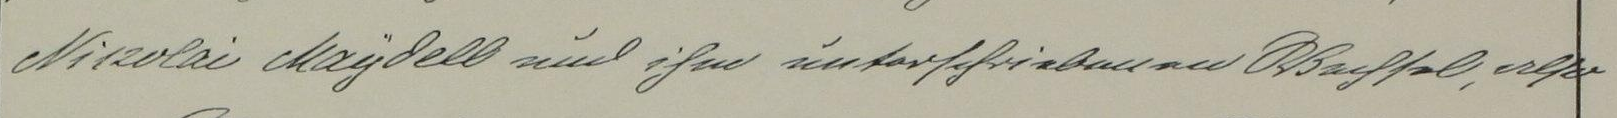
Nikolai Maydell und ihm unterschriebenen Wechsel, also
